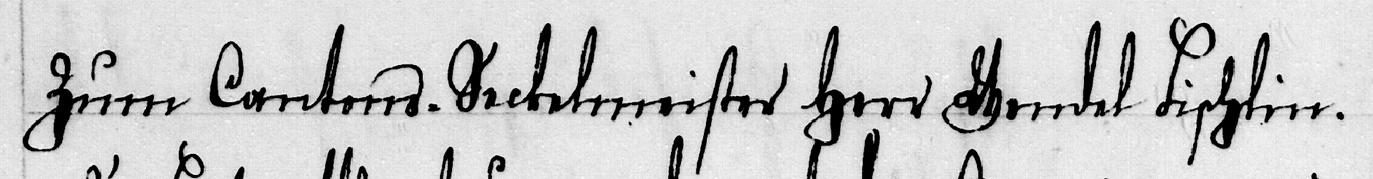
zum Cantons-Seckelmeister Herr Wendel Fischlin.
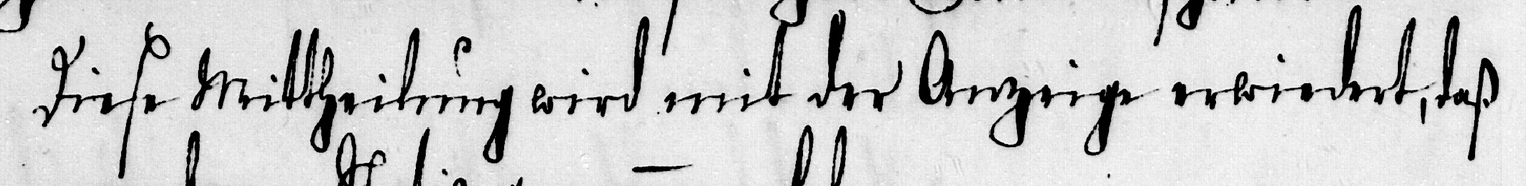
Diese Mittheilung wird mit der Anzeige erwiedert, daß
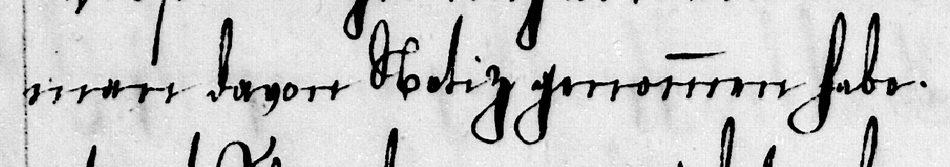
man davon Notiz genommen habe.
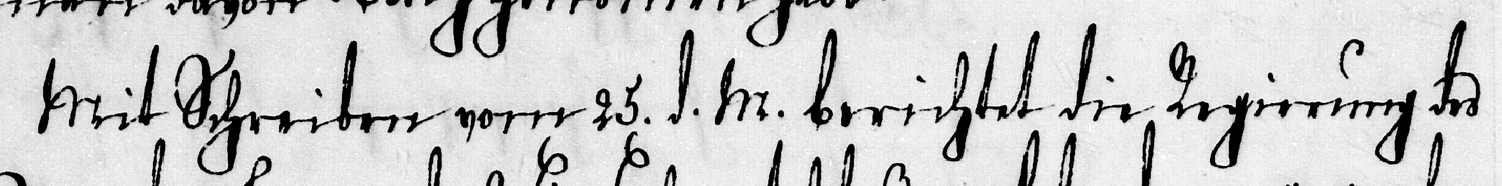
Mit Schreiben vom 25. d. M. berichtet die Regierung des
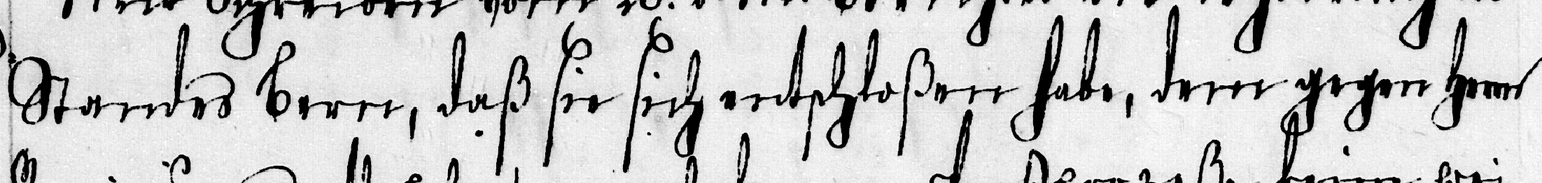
Standes Bern, daß sie sich entschloßen habe, dem gegen Her¬
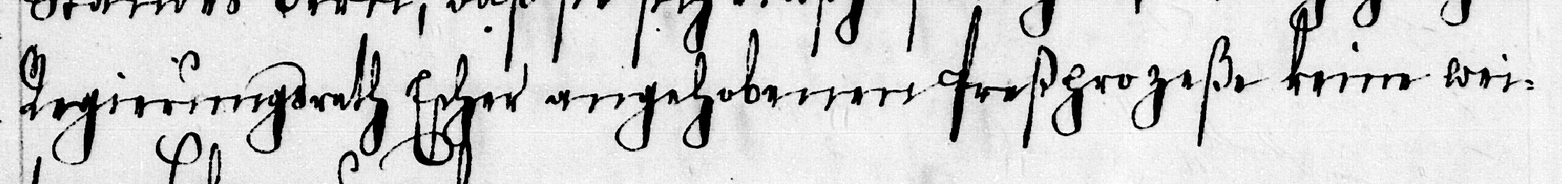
Regierungsrath Escher angehobenen Preßprozeße keine wei¬
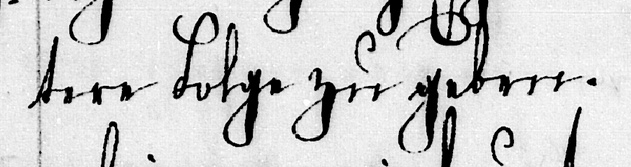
tere Folge zu geben.
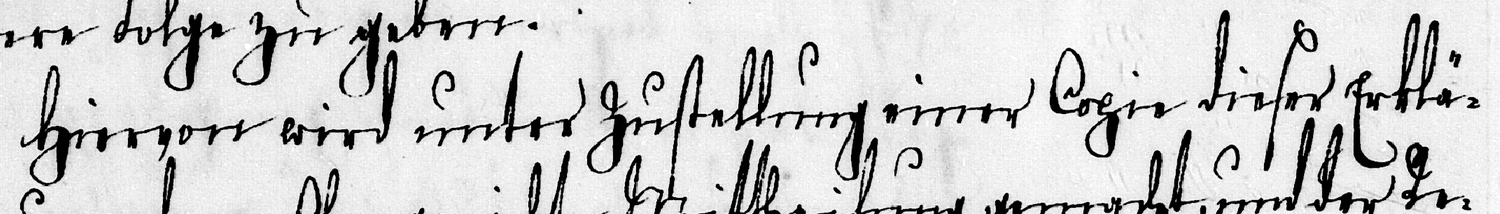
Hiervon wird unter Zustellung einer Copie dieser Erklä¬
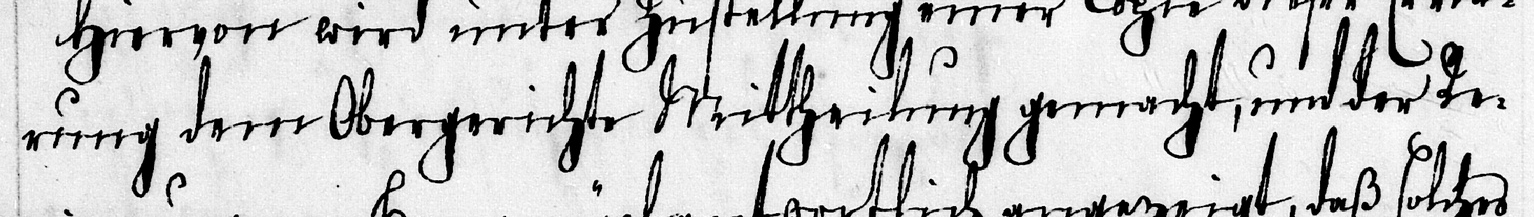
rung dem Obergerichte Mittheilung gemacht, und der Re¬
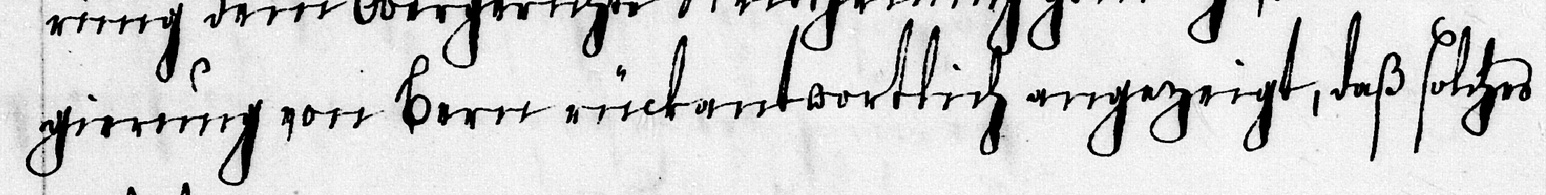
gierung von Bern rückantwortlich angezeigt, daß solches
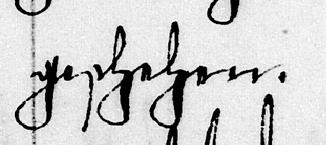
geschehen.
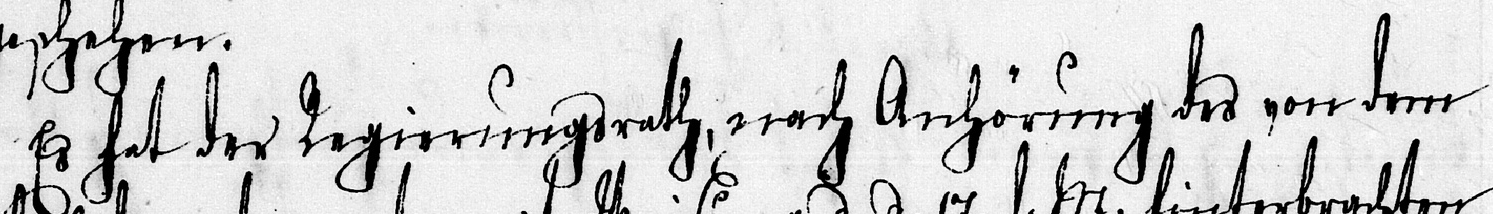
Es hat der Regierungsrath, nach Anhörung des von dem
